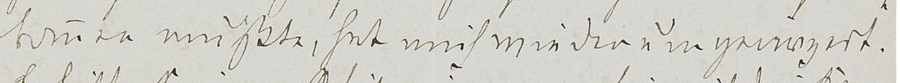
kommen mußte, hat mich wiederum geärgert.
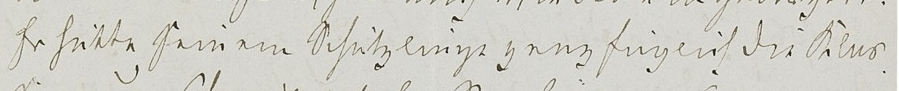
Er hätte seinem Schützlinge ganz füglich die Klas-
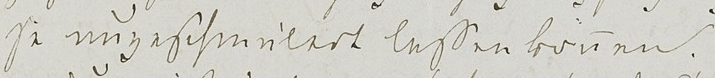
se ungeschmälert lassen können.
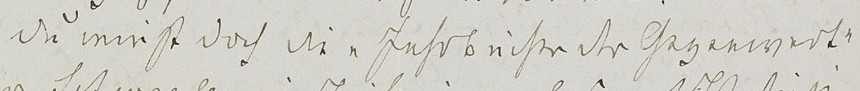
Du wirst doch die «Jahrbrichte der Gegenwart»
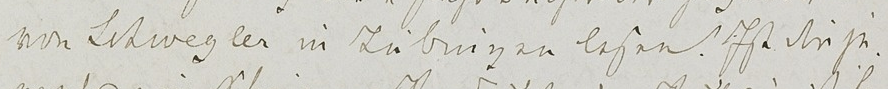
von Schwegler in Tübingen lesen. Ist dir je-
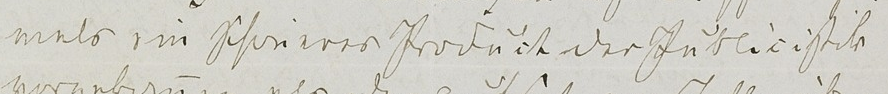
mals ein schöneres Product der Publicistik
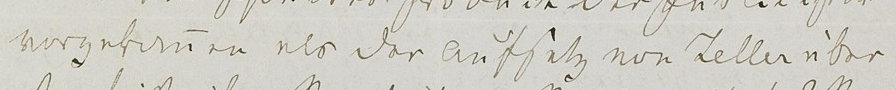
vorgekommen als der Aufsatz von Zeller über
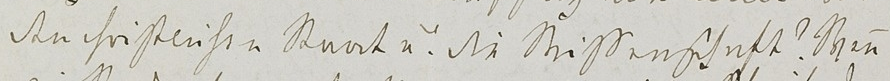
den christlichen Staat u. die Wissenschaft? Wenn
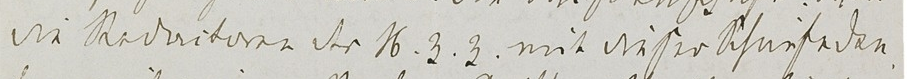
die Redactoren der N.Z.Z. mit dieser Schärfe den-
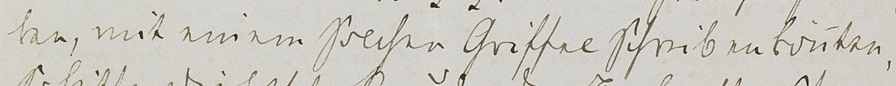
ken, mit einem solchen Griffel schreiben könnten,
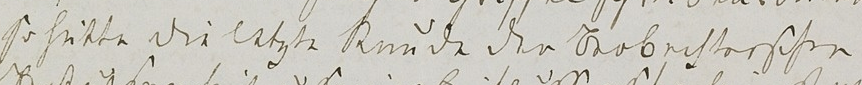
so hätte die letzte Stunde der Beobachterschen
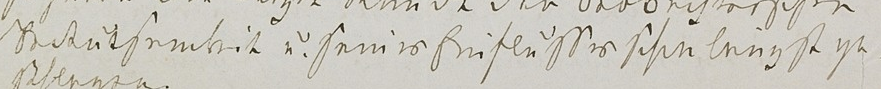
Bedeutsamkeit u. seines Einflusses schon längst ge-
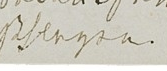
schlagen.
